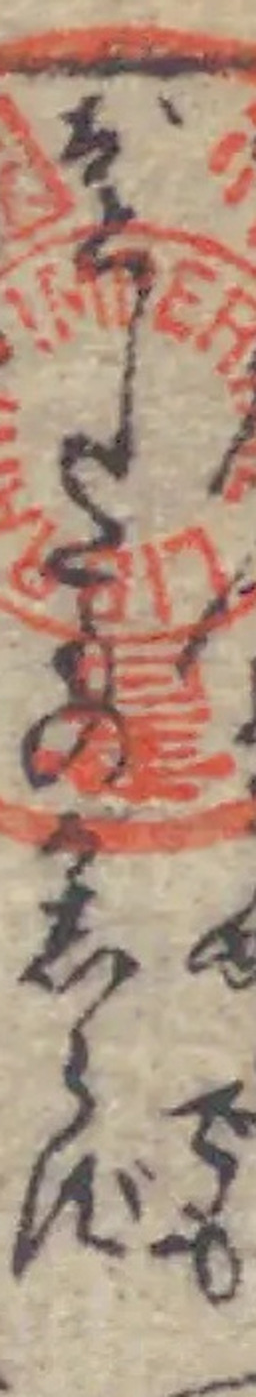おとしたものかしらず
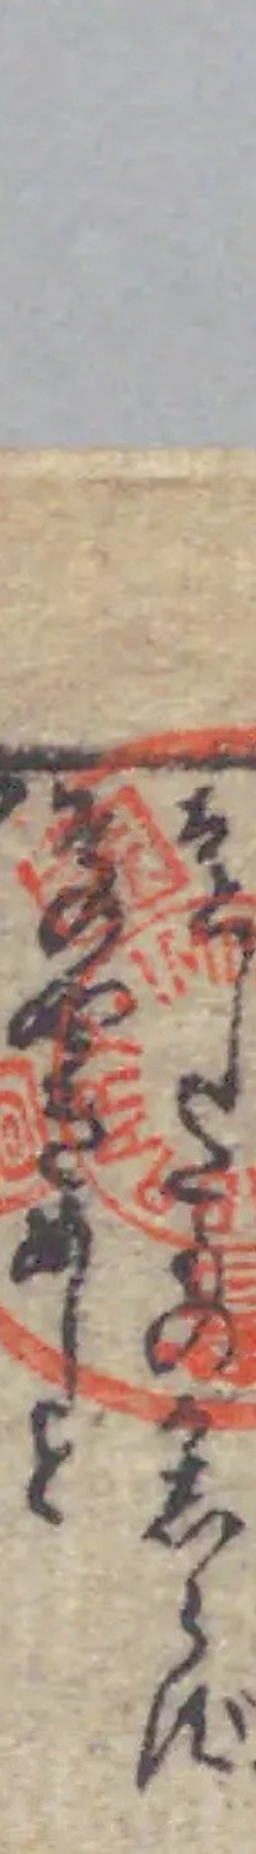そのやきめしを
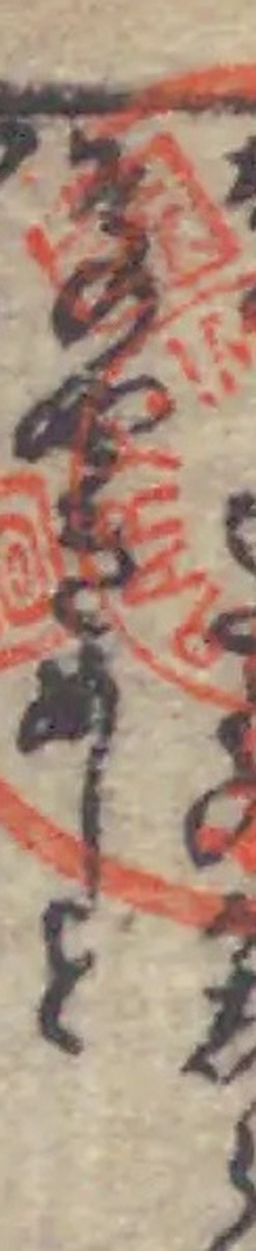そのやきめしを
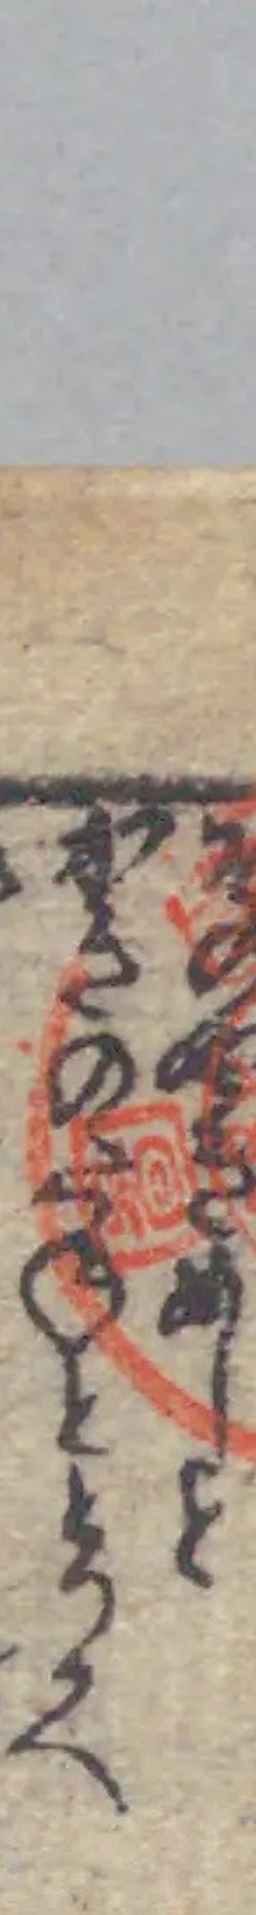かきのたねととりかへ
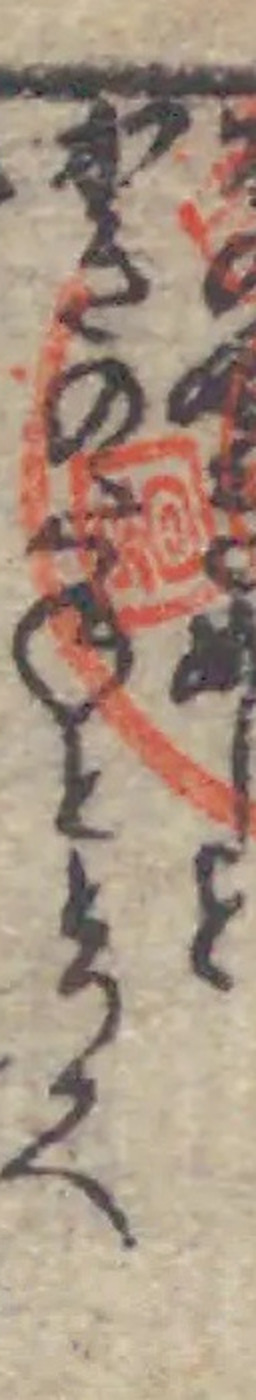かきのたねととりかへ
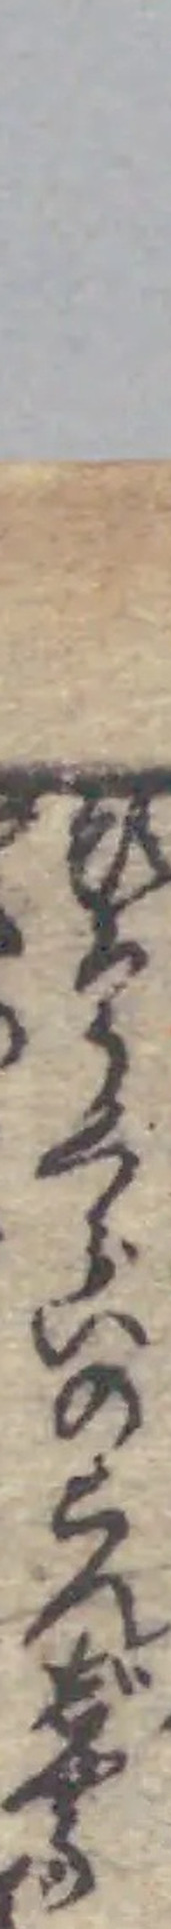ひろうくらいのこんじやうで
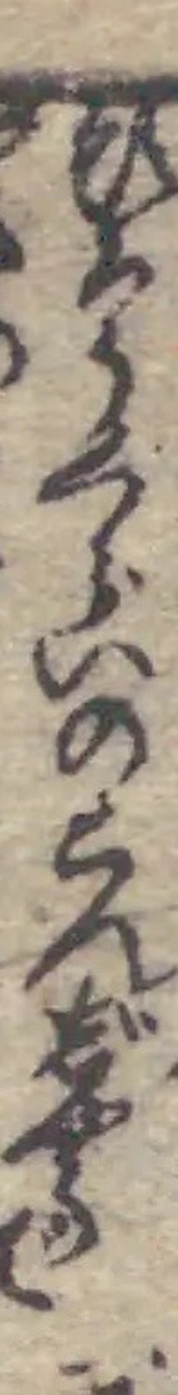ひろうくらいのこんじやうで
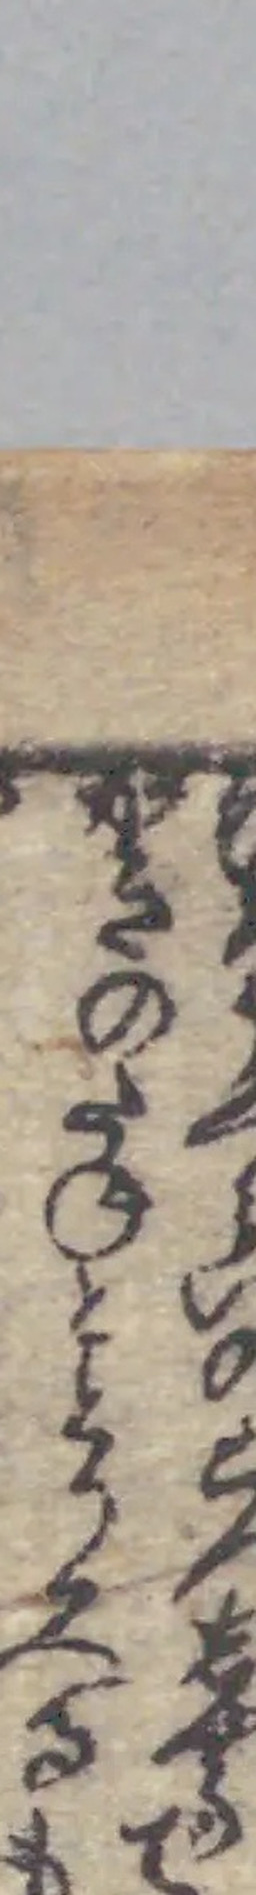かきのたねととりかへ
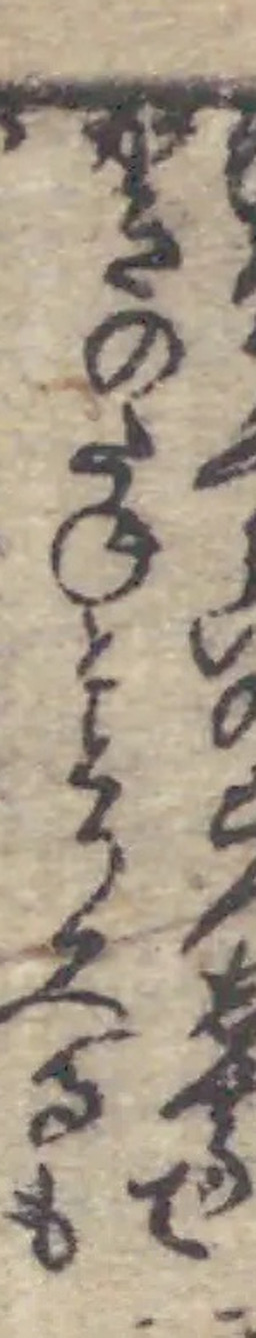かきのたねととりかへるも
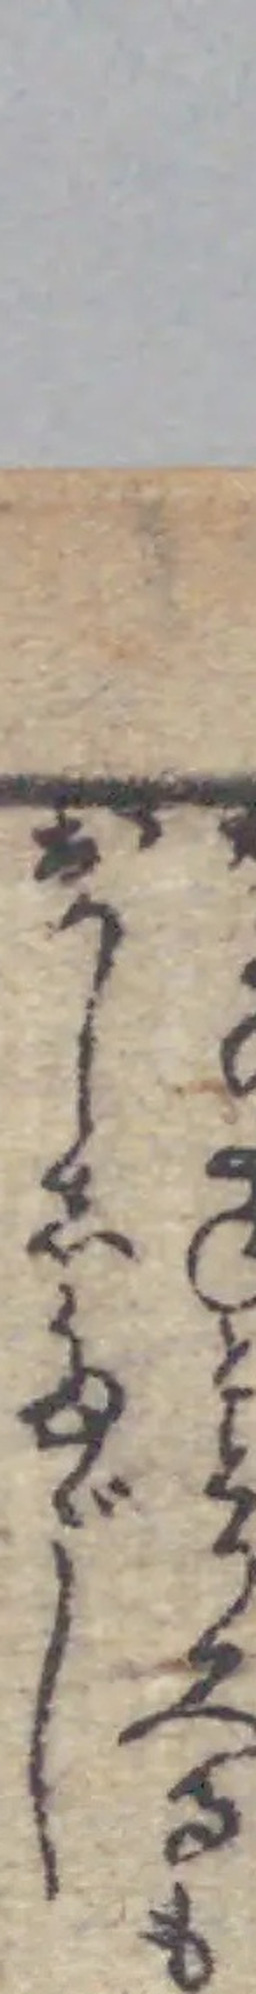おかししたゞし
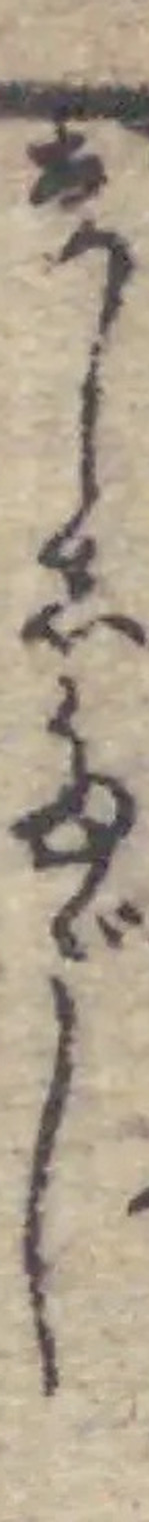おかししたゞし
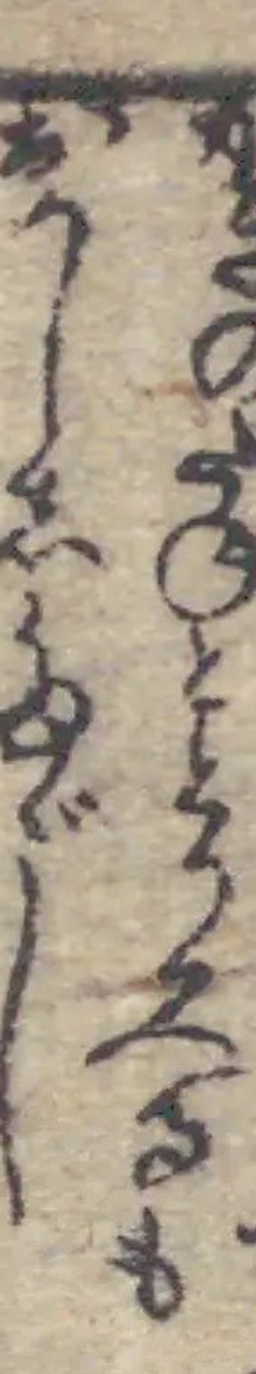おかししたゞし
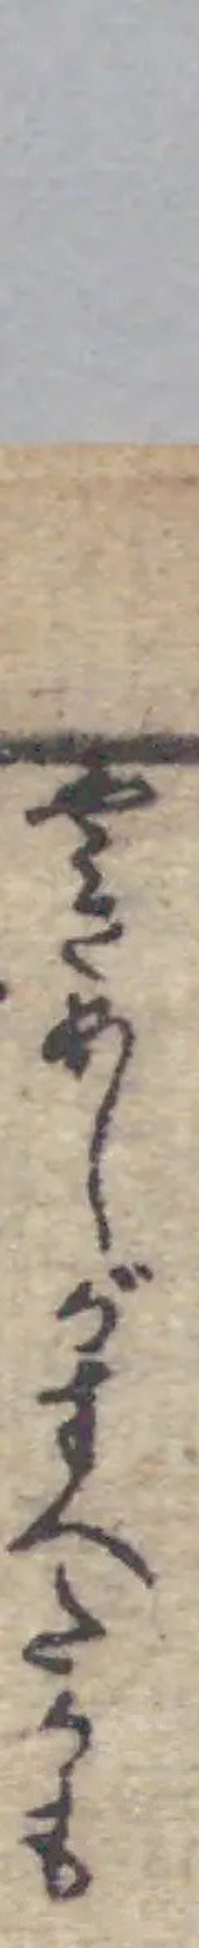やきめしがすへたかも
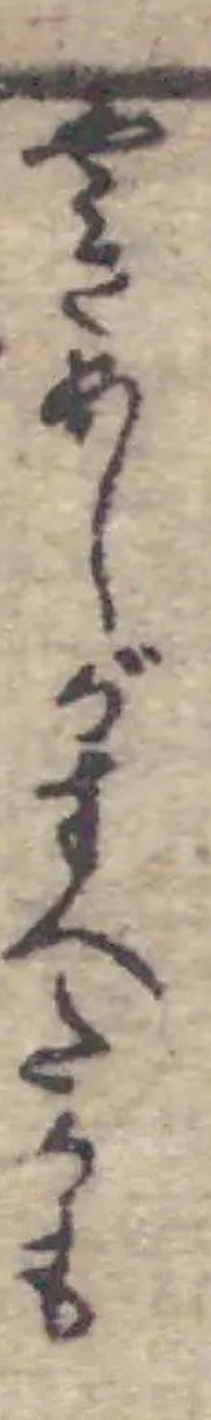やきめしがすへたかも
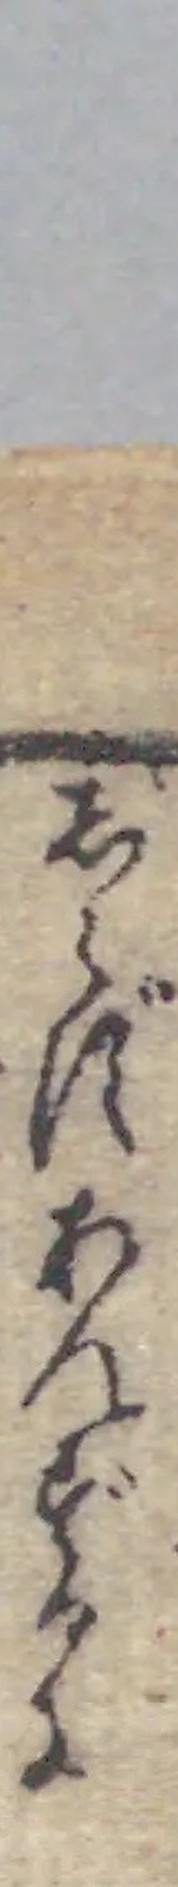しらずあんずるに
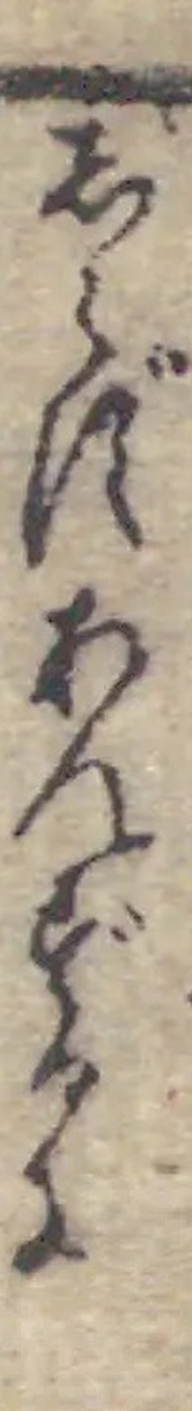しらずあんずるに
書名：蟹牛房挟多 3巻
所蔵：国立国会図書館 National Diet Library, JAPAN
